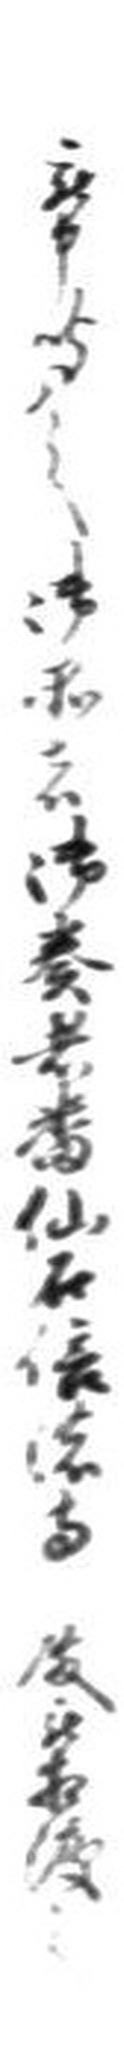被申聞之御品者御奏者番仙石信濃守殿被相渡之
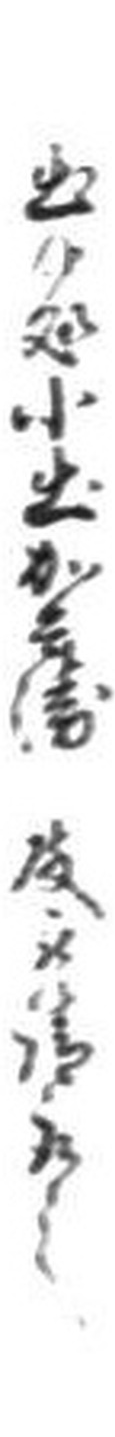出候処小出加兵衛殿被請取之
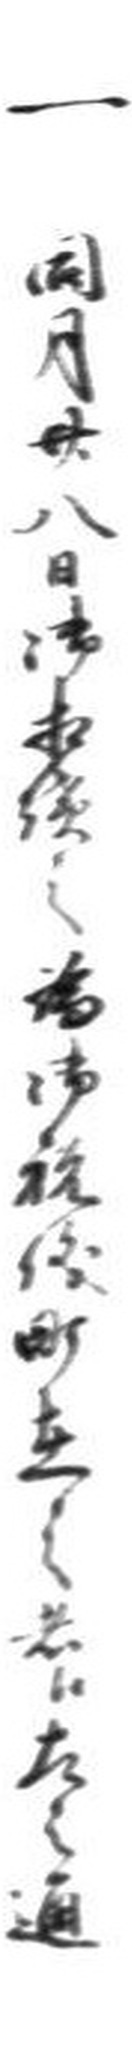一同月廿八日御相続之為御祝儀町在之者江左之通
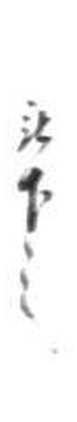被下之

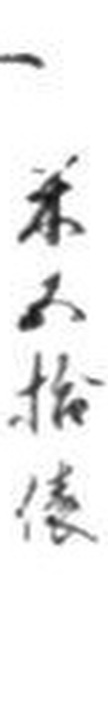米五拾俵
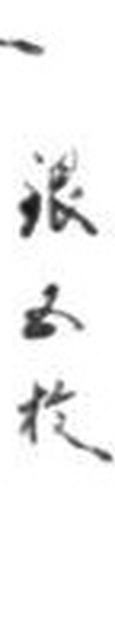銀五枚
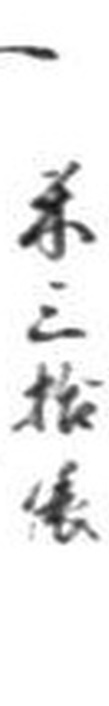米五拾俵
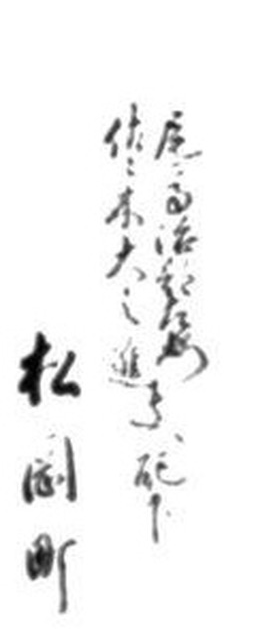佐々木大之進支配下
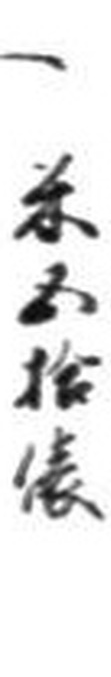米五拾俵
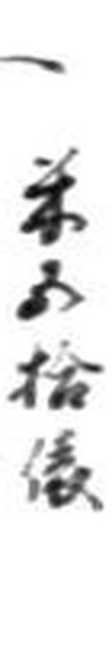米五拾俵
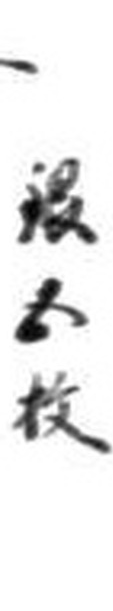銀五枚
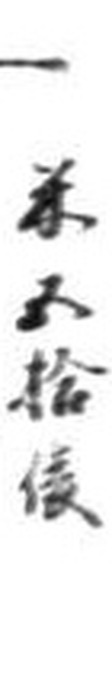米五拾俵
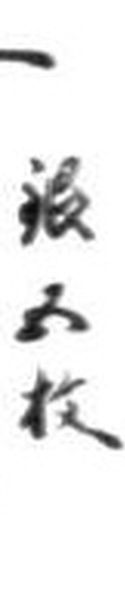銀五枚

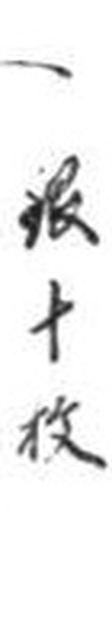銀十枚
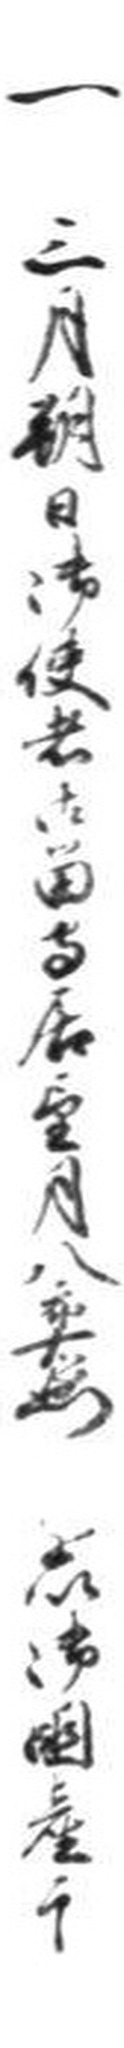一三月朔日御使者御留守居望月八郎右衛門を以御国産干
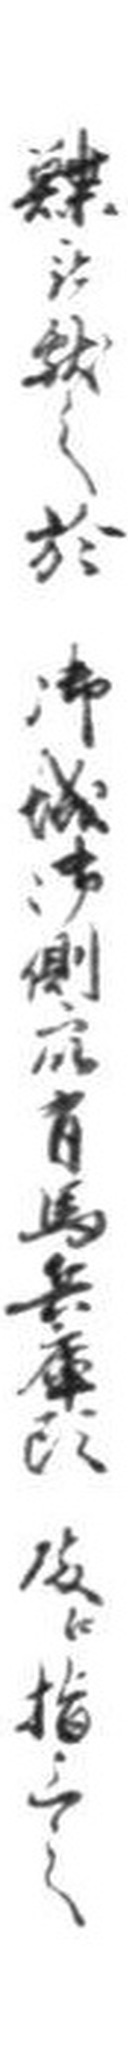鰈被献之於御城御側衆有馬兵庫頭殿江指上之
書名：家譜 三十六 宗昌公 従享保八年到同九年
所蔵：福井県文書館 Fukui Prefectural Archives
